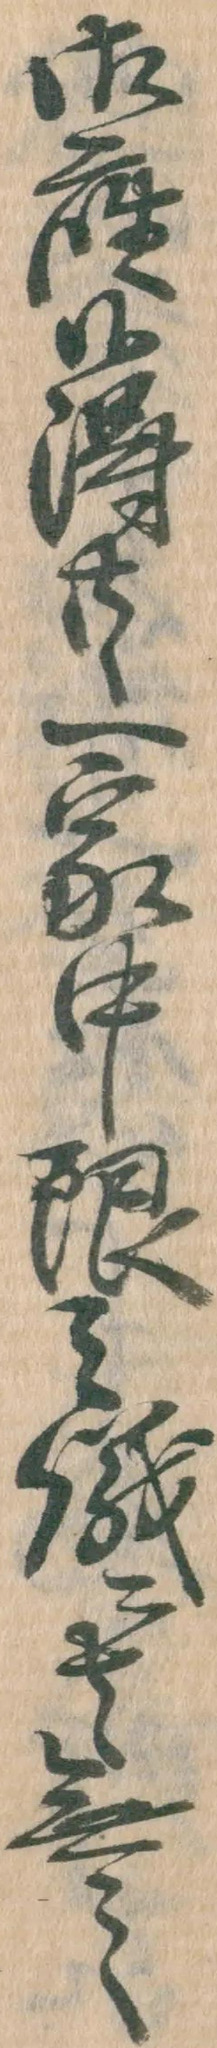御座候得共一家中限之儀ニは無之
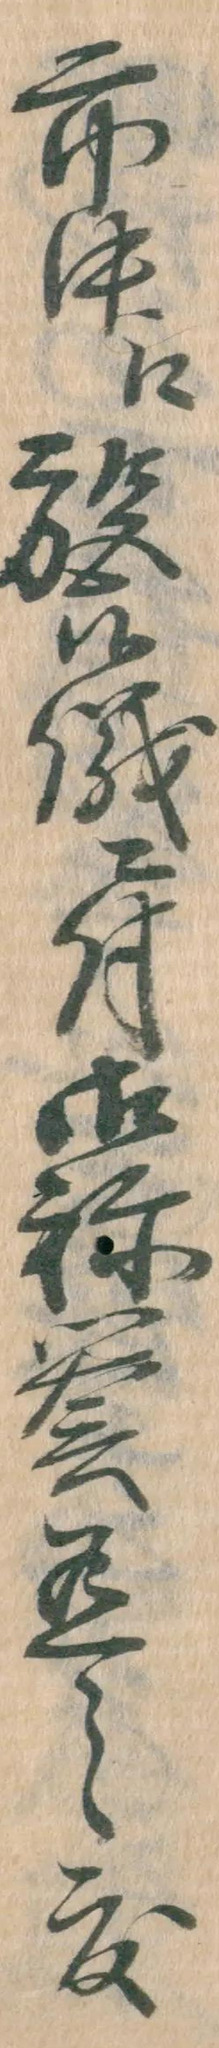市中え施候儀ニ付相称誉有之度
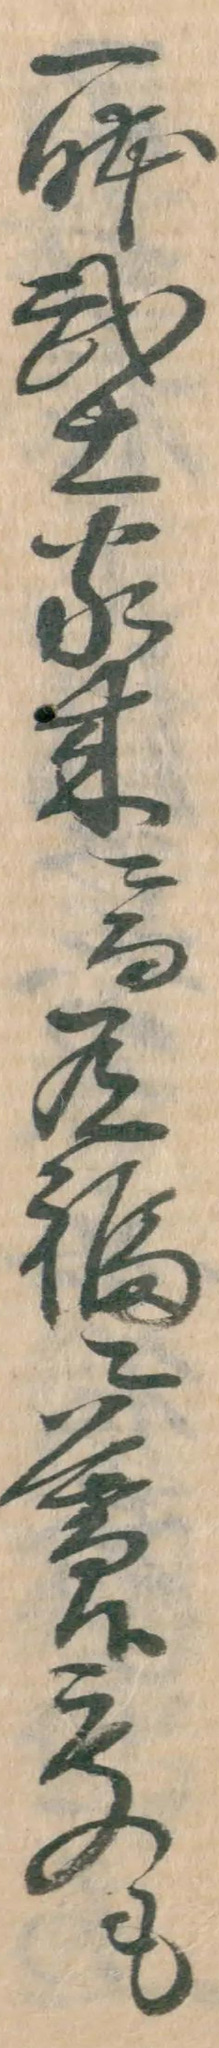一躰武士家来ニ而有福ニ暮候ものも

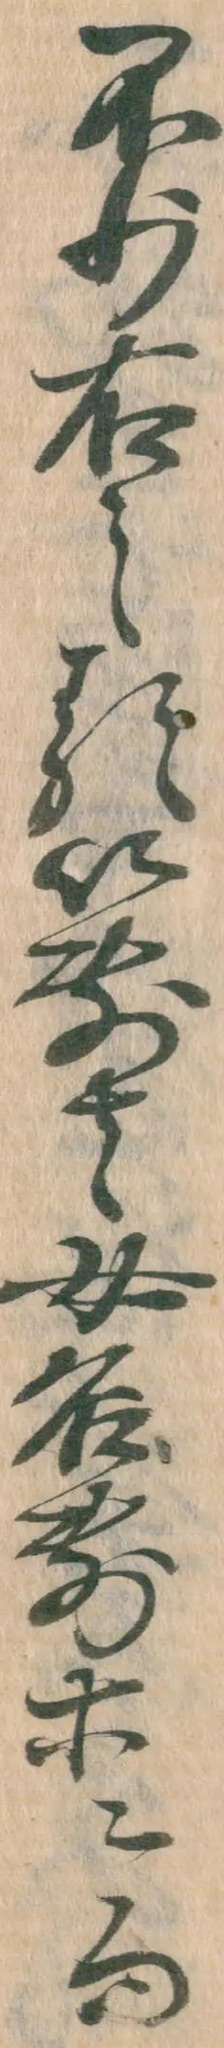不少右之類以前は女名前等ニ而
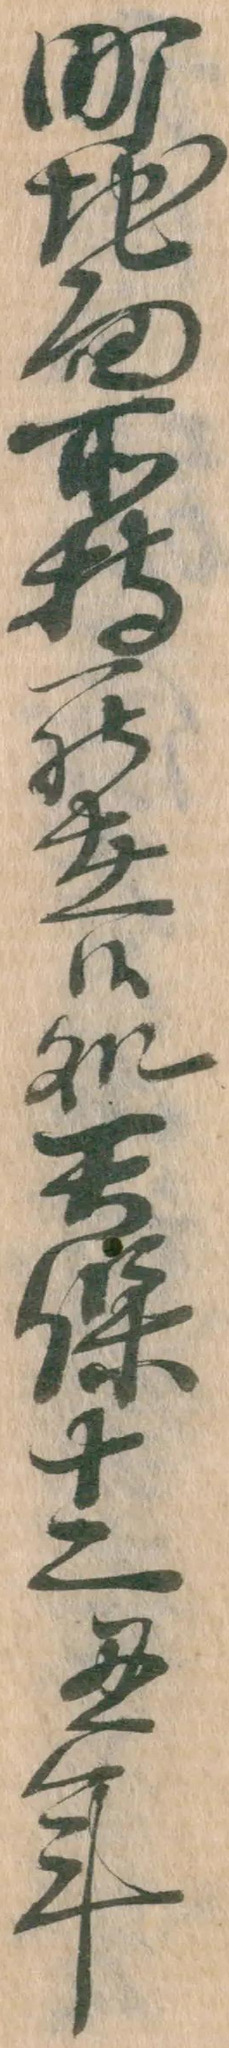町地面所持罷在候処天保十二丑年
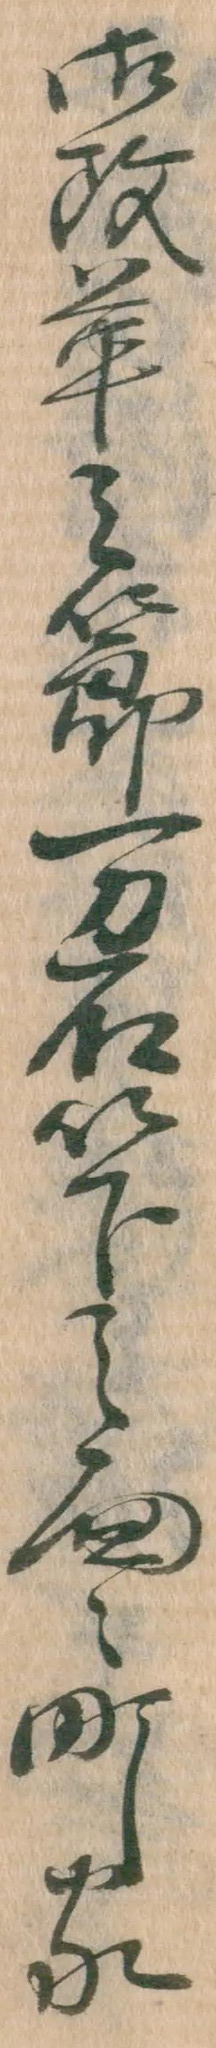御改革之節万石以下之面々町家
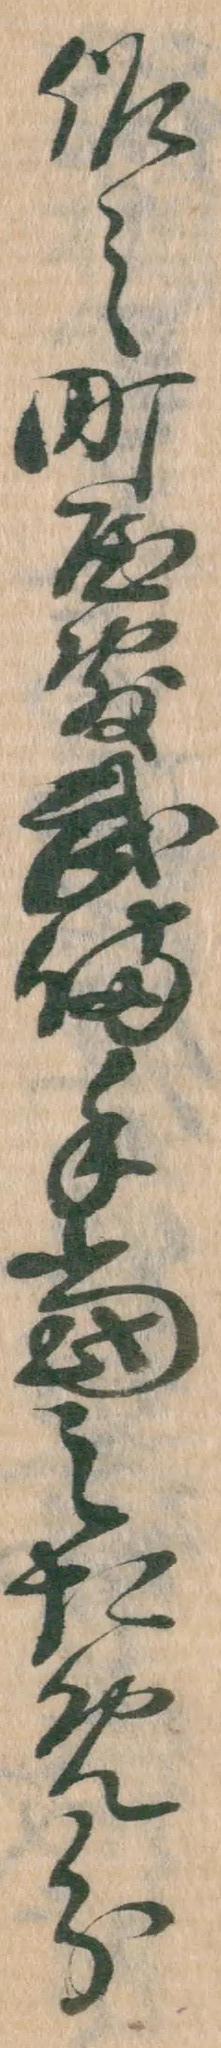作之町屋敷武備手当之ため分
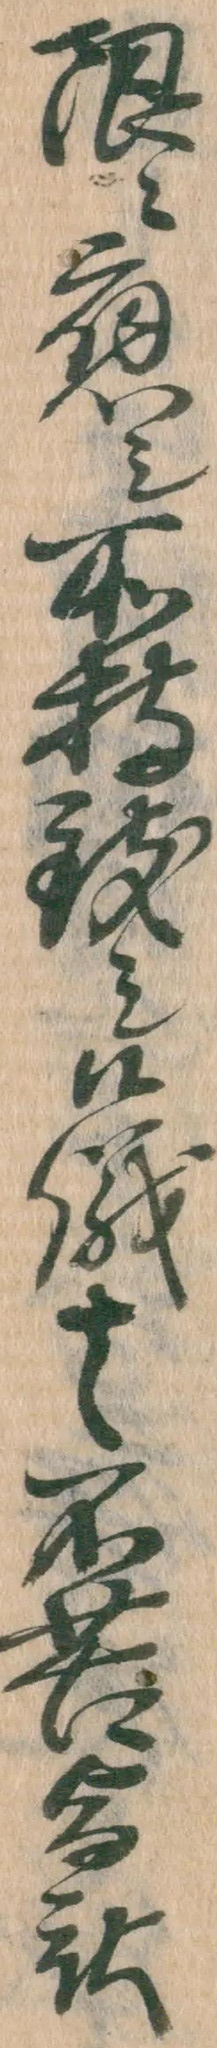限ニ応シ所持致シ候儀は不苦旨被
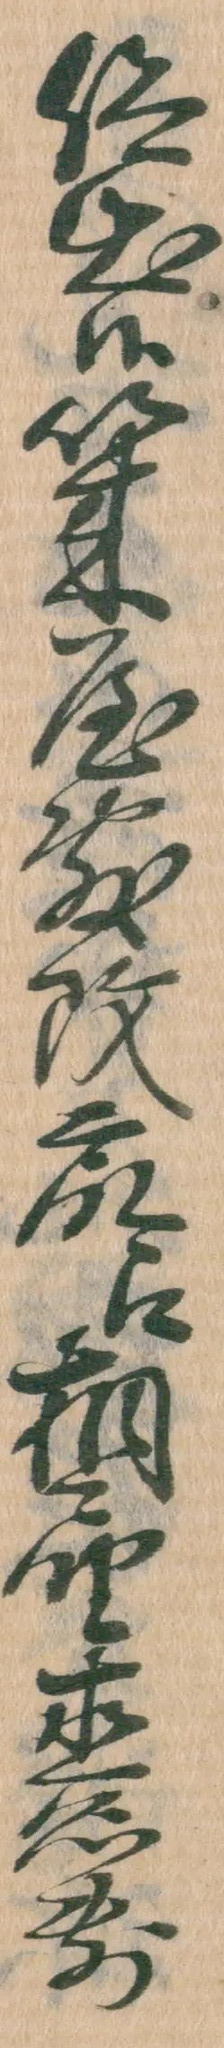仰出候以来屋敷改衆え相届直名前
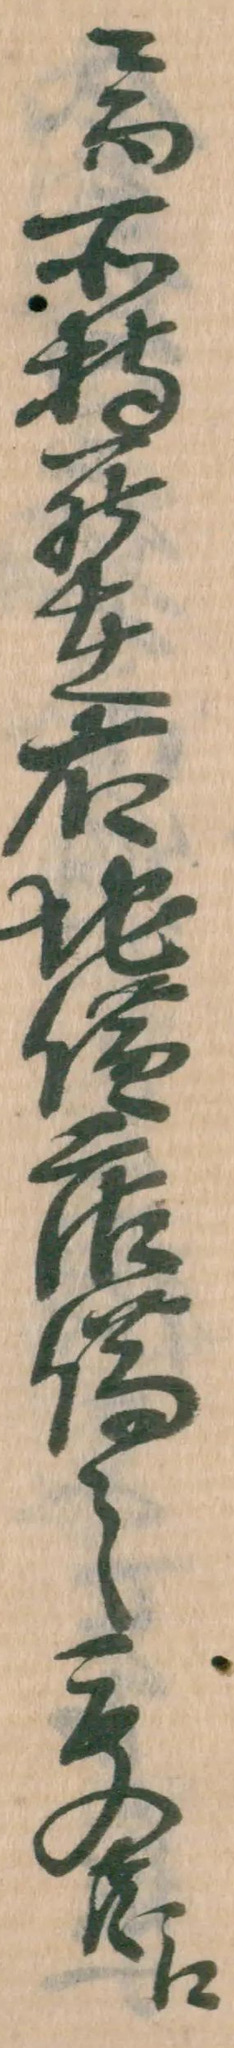ニ而所持罷在右地借店借之もの共え
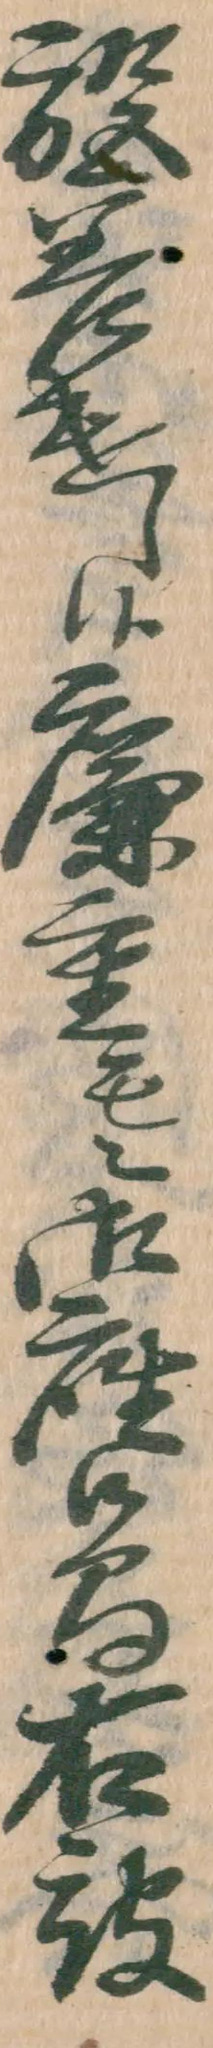施差遣し候廉重モニ御座候間右被
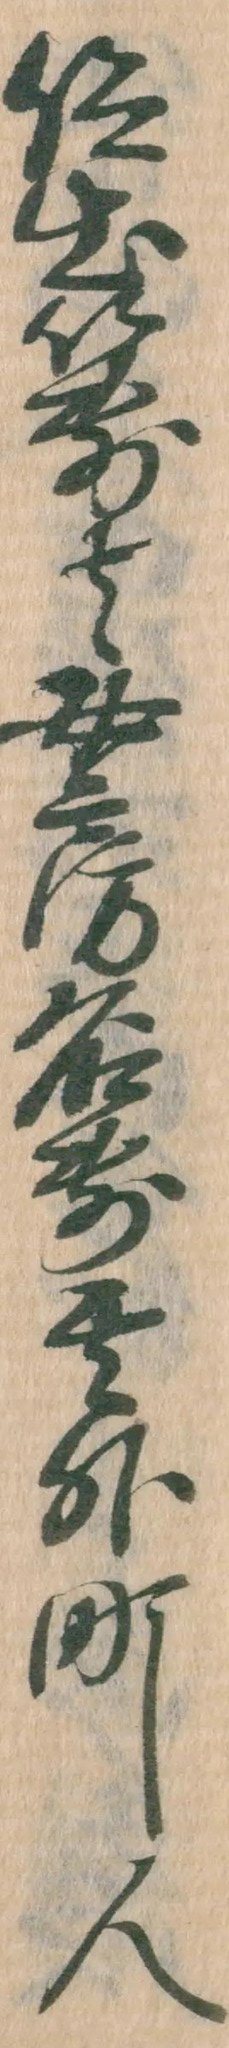仰出以前は女房名前其外町人
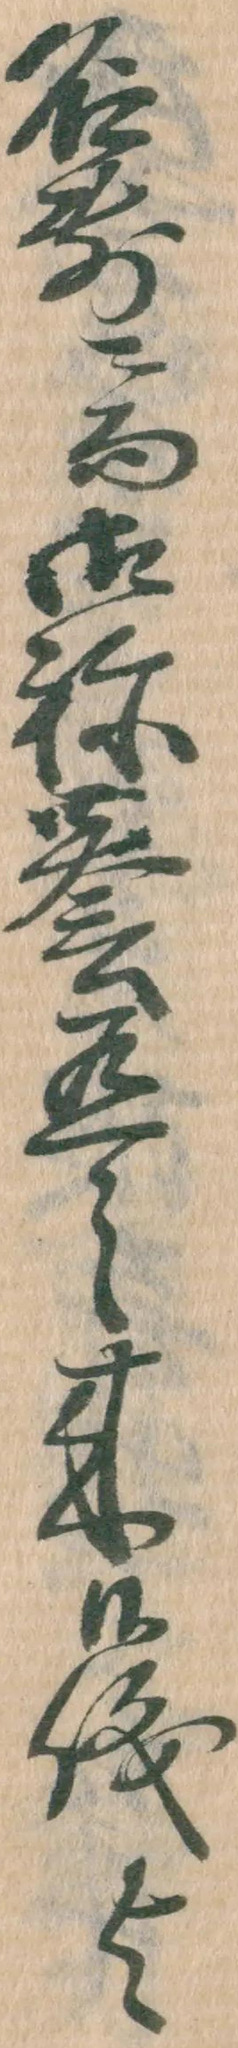名前ニ而御称誉有之来候儀と
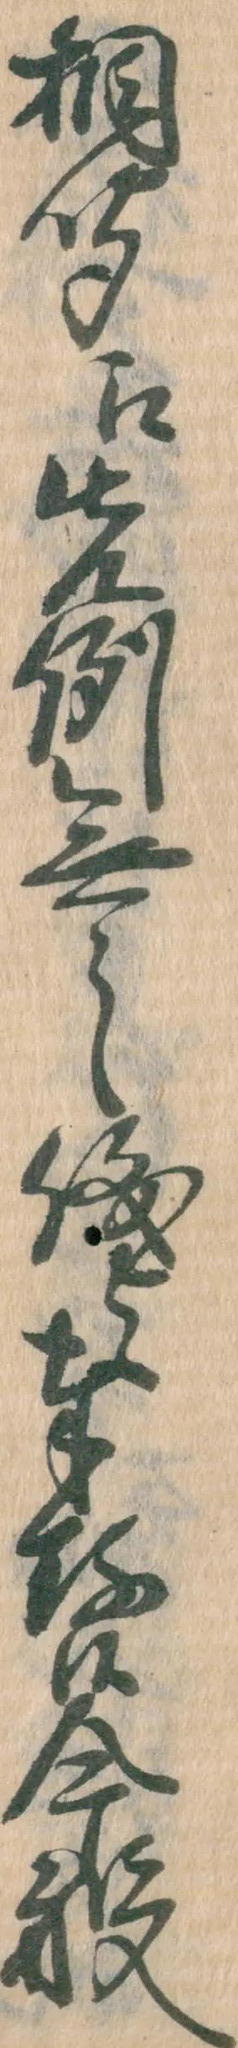相聞え先例無之儀と奉存候今般
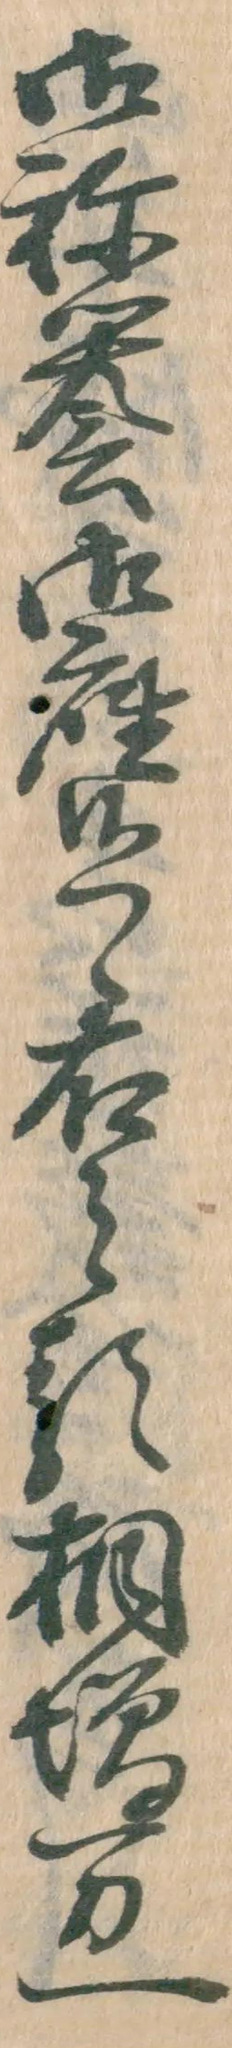御称誉御座候ハヽ右之類相増万一

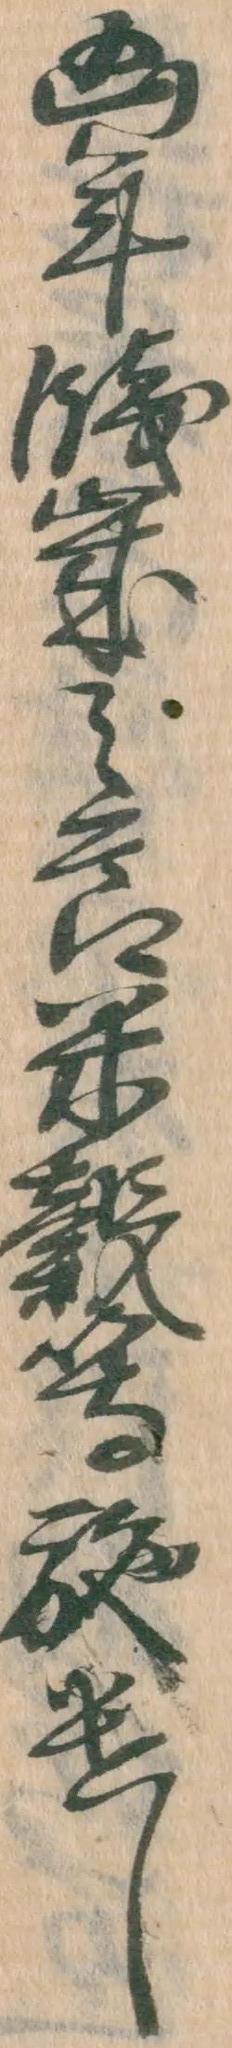凶年饑歳之節米穀等施遣し
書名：武家方并寺院等ニテ施差出候一件
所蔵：国立国会図書館 National Diet Library, JAPAN
